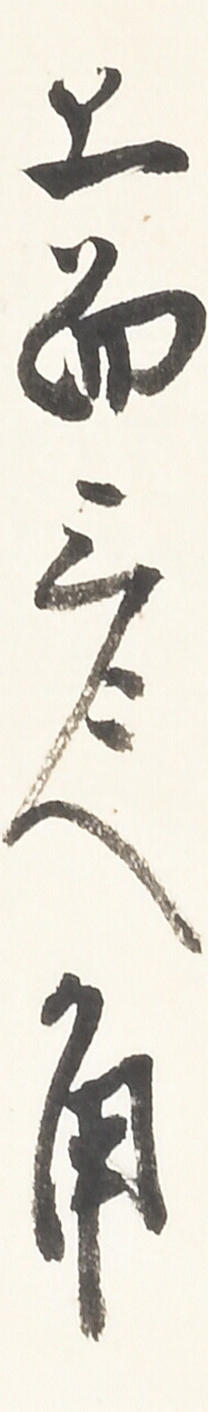上面三尺角
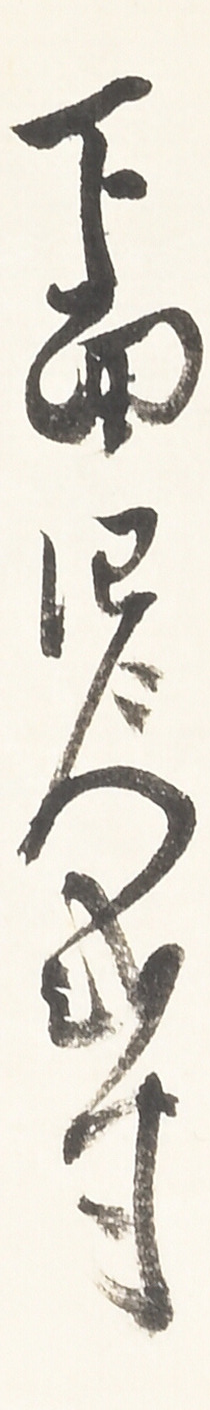下面四尺弐寸
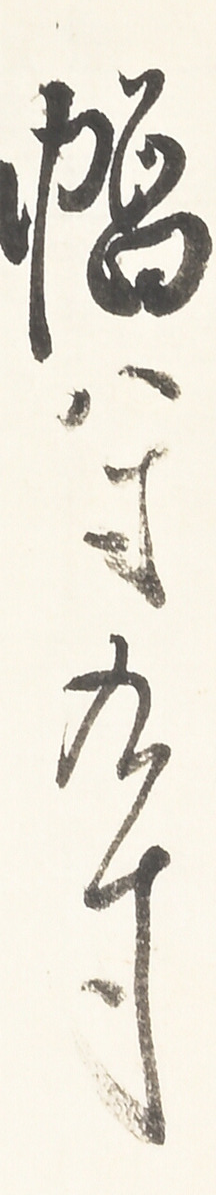幅八寸九寸
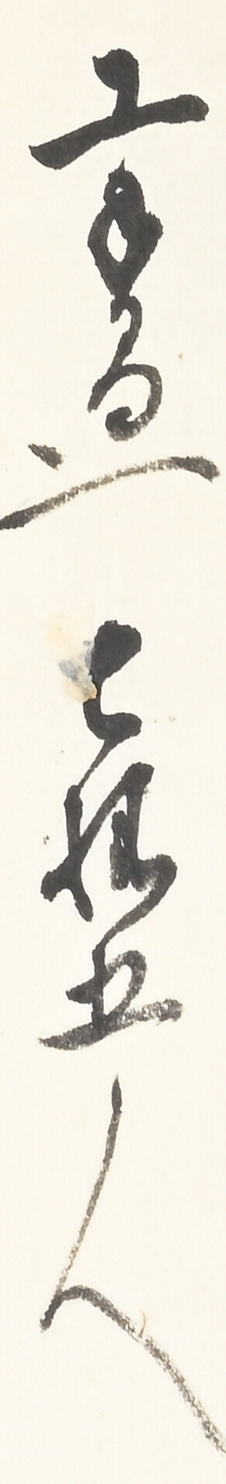工手間〆七拾五人

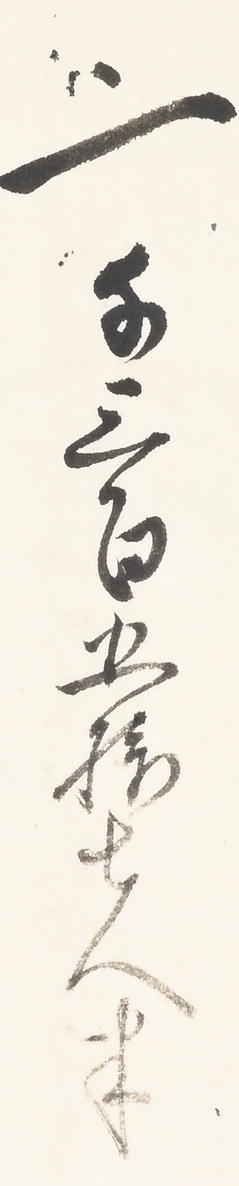〆千三百五拾七人半
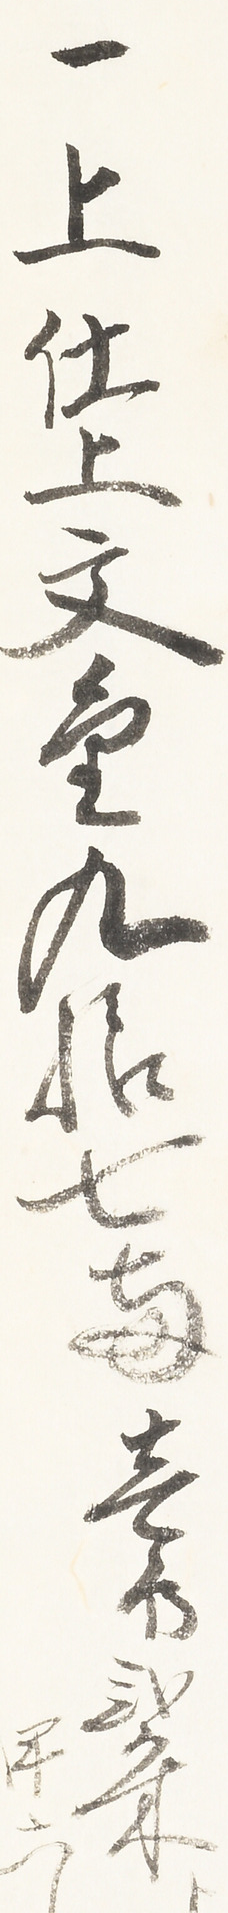一上仕上文金九拾七両壱分弐朱ト
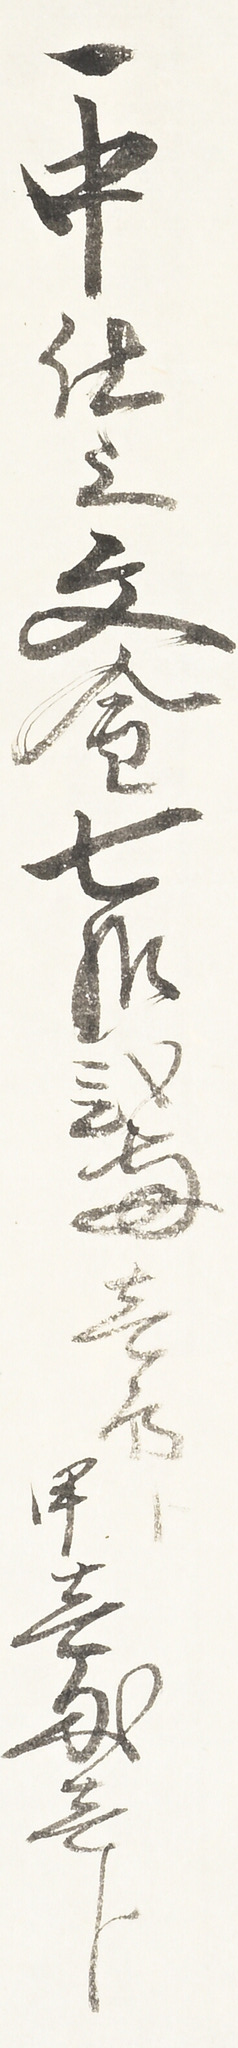一中仕上文金七拾弐両壱分ト甲壱匁壱分

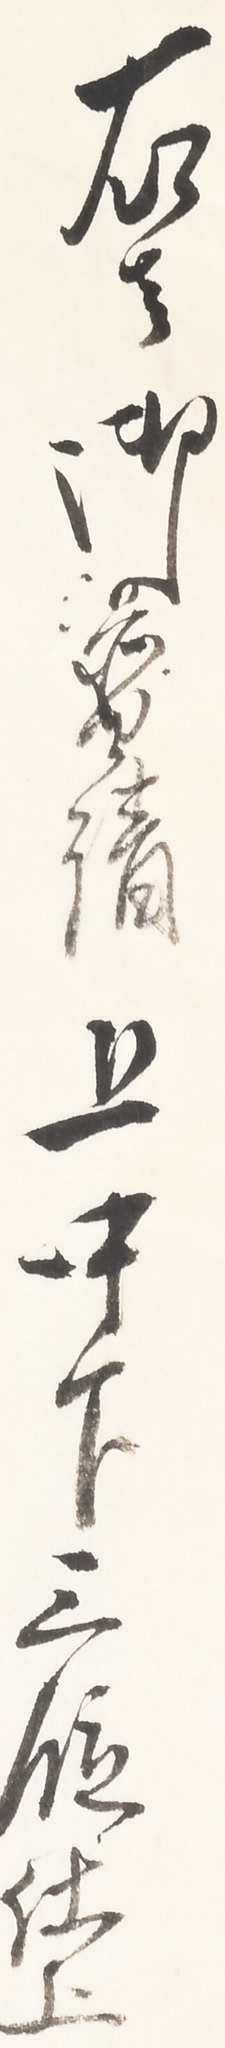右者御普請上中下三段仕上
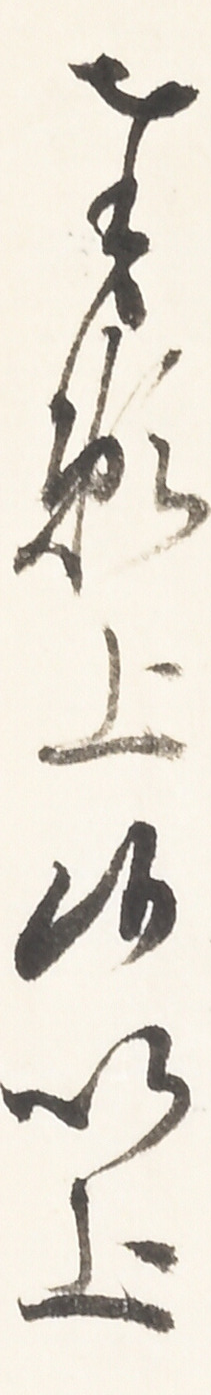奉願上候以上
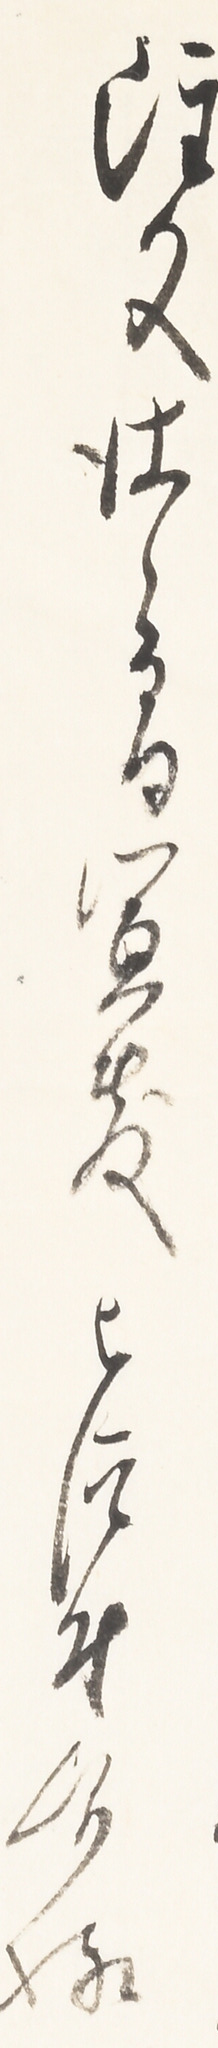注文仕候間宜敷被仰付候様
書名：天保十年亥六月日玉垣御注文書上帳
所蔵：伊那市立高遠町図書館・合同会社AMANE
